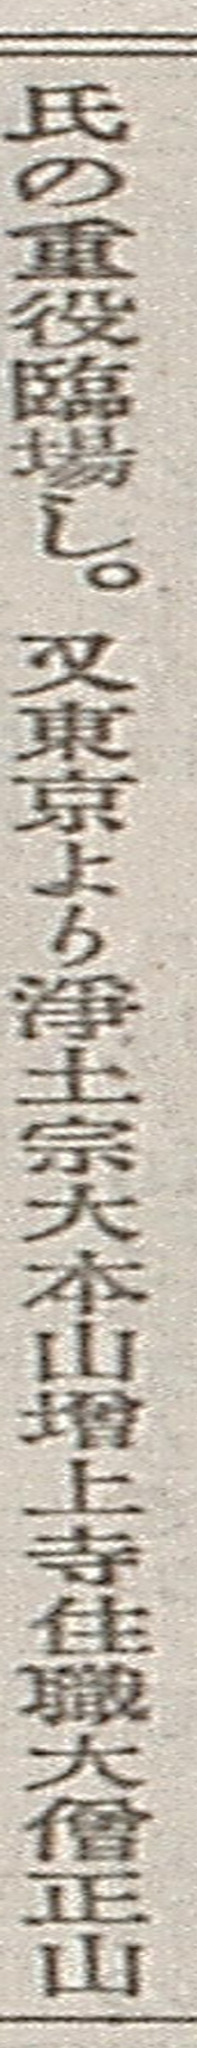氏の重役臨場し。又東京より浄土宗大本山増上寺住職大僧正山
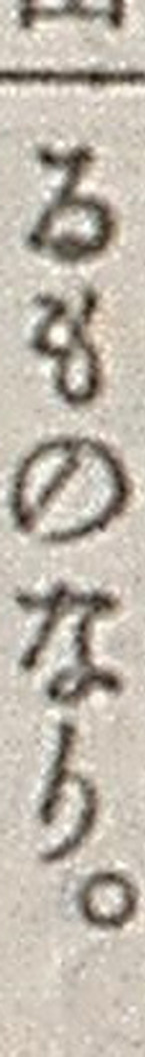るものなり。
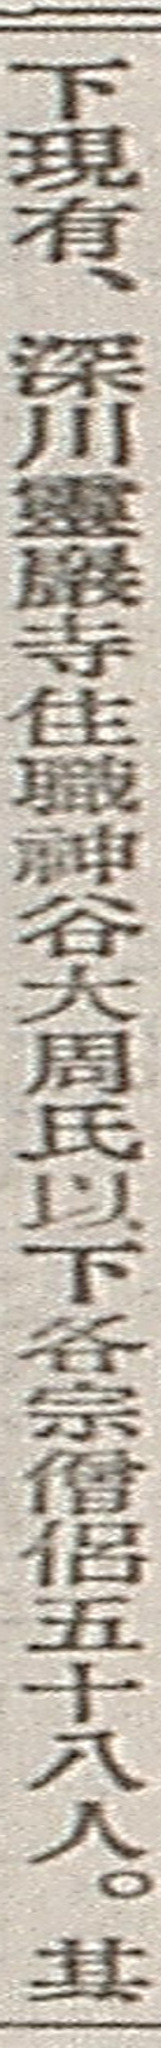下現有、深川霊巌寺住職神谷大周氏以下各宗僧侶五十八人。其
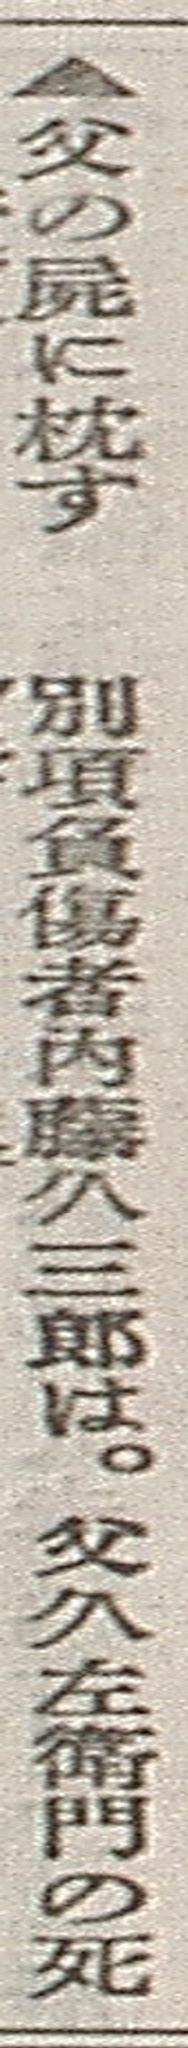▲父の屍に枕す別項負傷者内藤久三郎は。父久左衛門の死
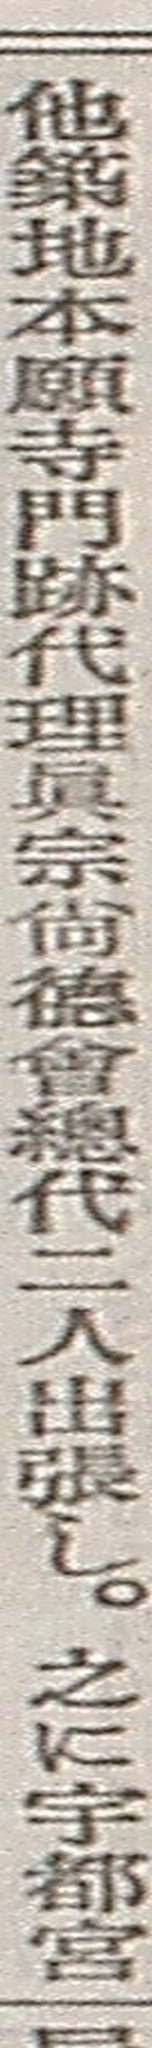他築地本願寺門跡代理真宗尚徳会総代二人出張し。之に宇都宮
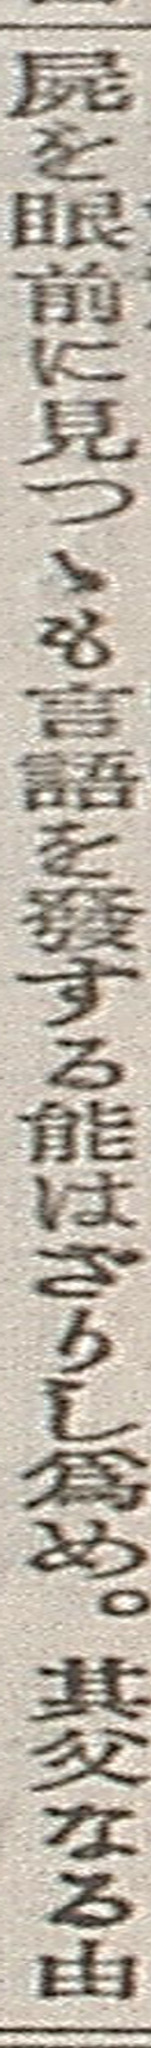屍を眼前に見つゝも言語を発する能はざりし為め。其父なる由
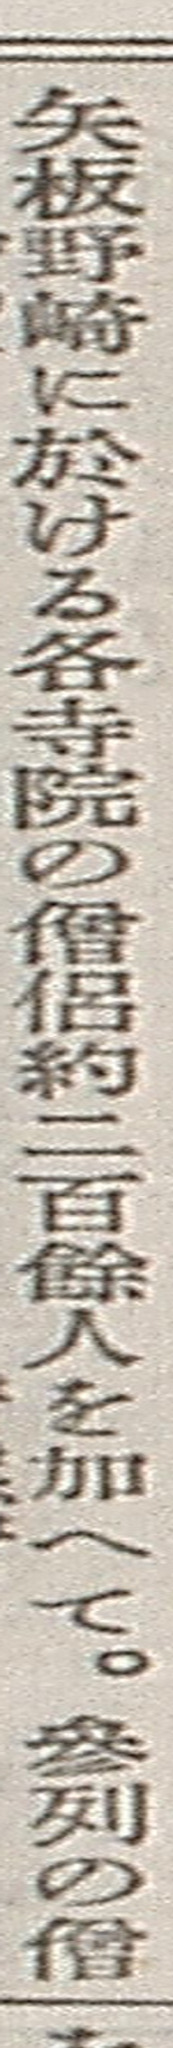矢板野崎に於ける各寺院の僧侶約二百余人を加へて。参列の僧
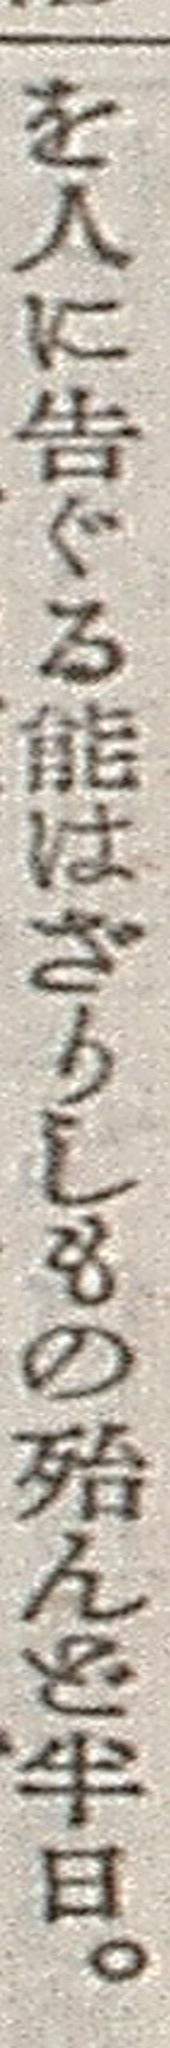を人に告ぐる能はざりしもの殆んど半日。
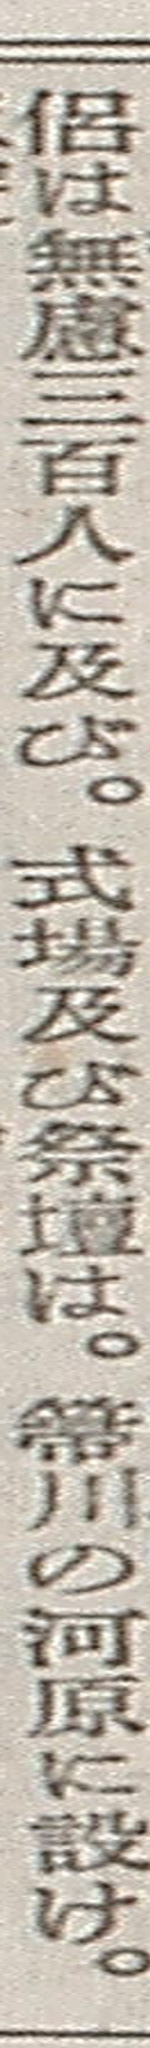侶は無慮三百人に及び。式場及び祭壇は。箒川の河原に設け。
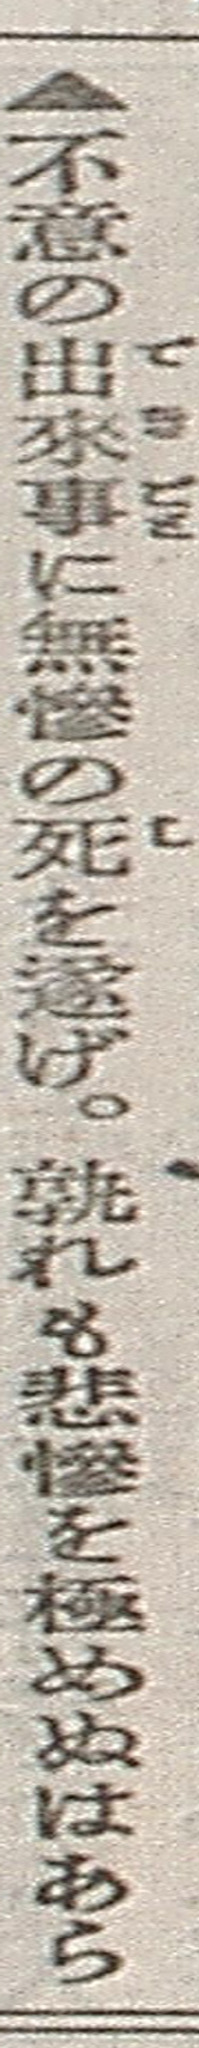▲不意の出来事に無惨の死を遂げ。孰れも悲惨を極めぬはあら
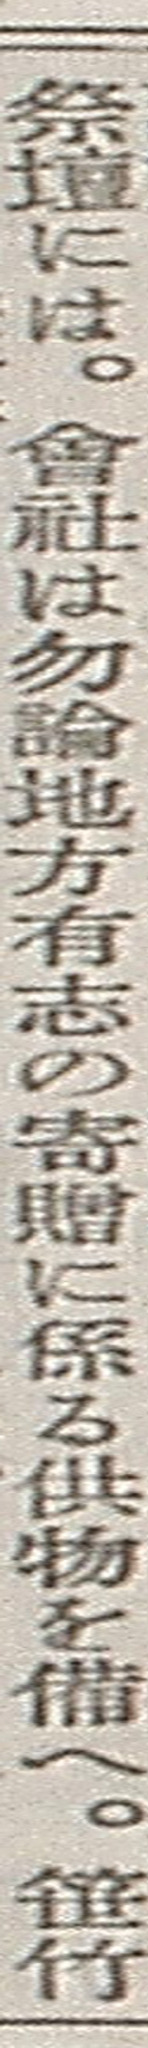祭壇には。会社は勿論地方有志の寄贈に係る供物を備へ。笹竹
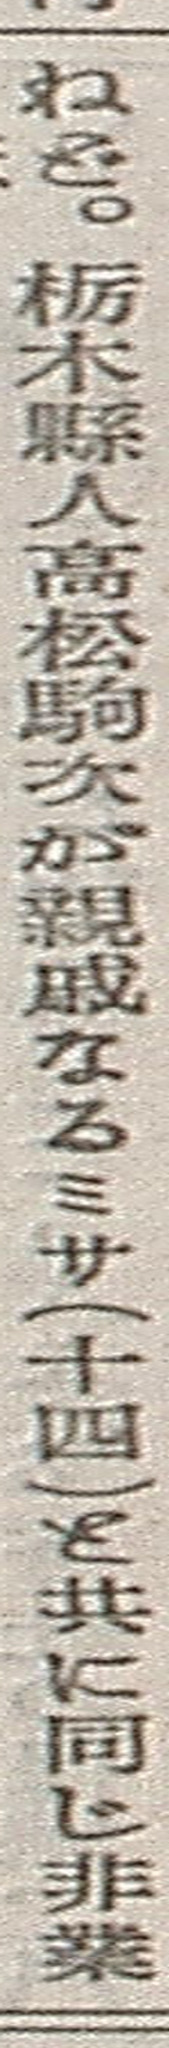ねど。栃木県人高松駒次が親戚なるミサと共に同じ非業
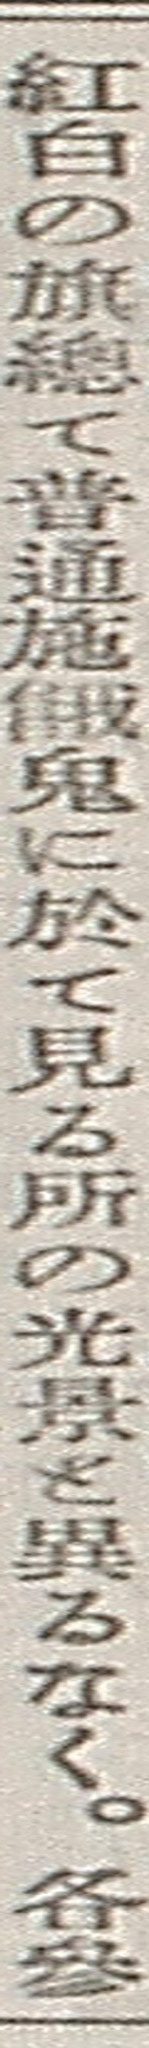紅白の旗総て普通施餓鬼に於て見る所の光景と異るなく。各参
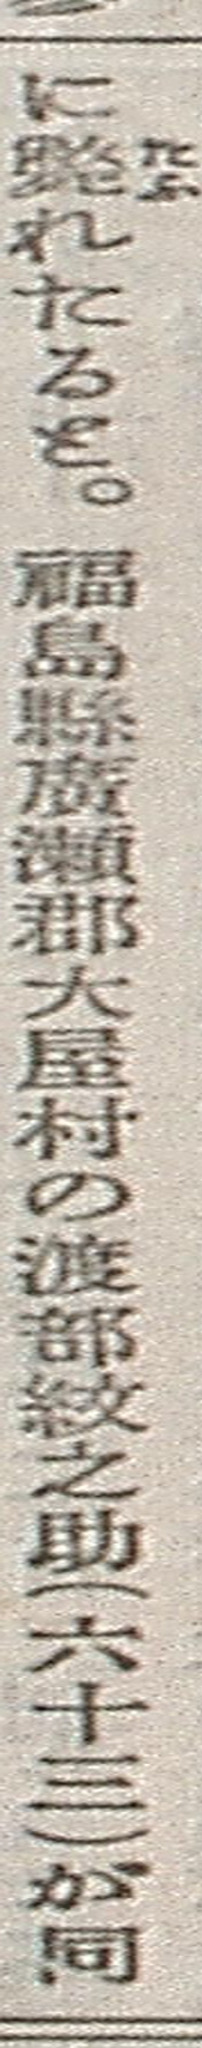に斃れたると。福島県廣瀬郡大屋村の渡部紋之助が同
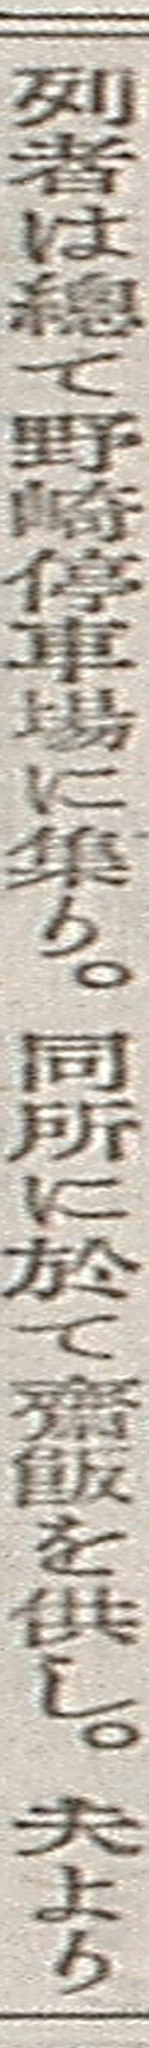列者は総て野崎停車場に集り。同所に於て斎飯を供し。夫より
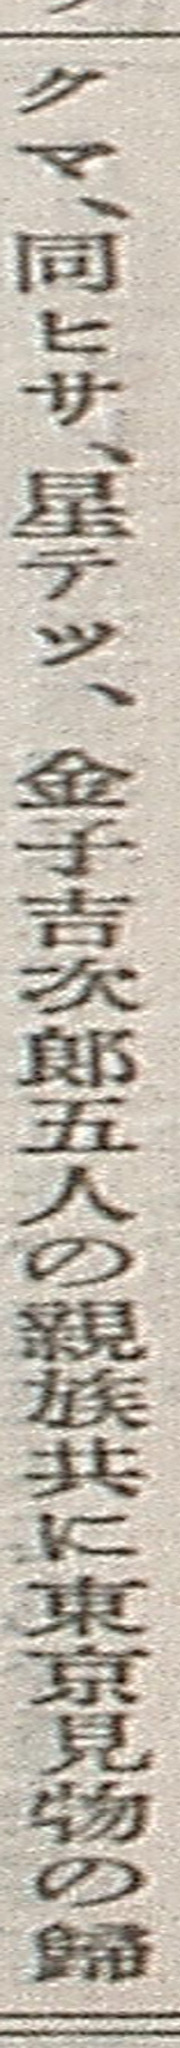クマ、同ヒサ、星テツ、金子吉次郎五人の親族共に東京見物の帰
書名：風俗畫報臨時増刊第百九十九號　明治三十二年十月各地災害圖會（前編之續）
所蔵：東京大学地震研究所図書室 Earthquake Research Institute Library, The University of Tokyo, JAPAN
